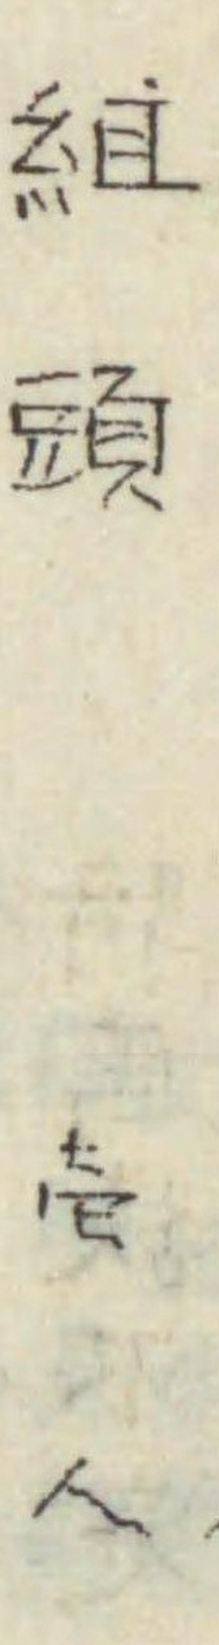組頭壱人
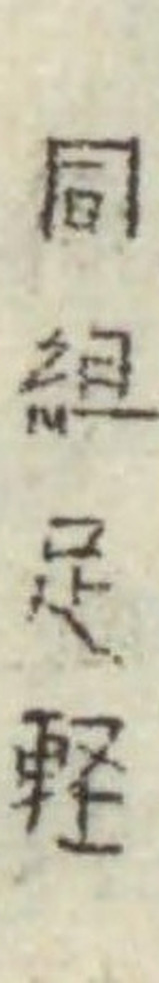同組足軽
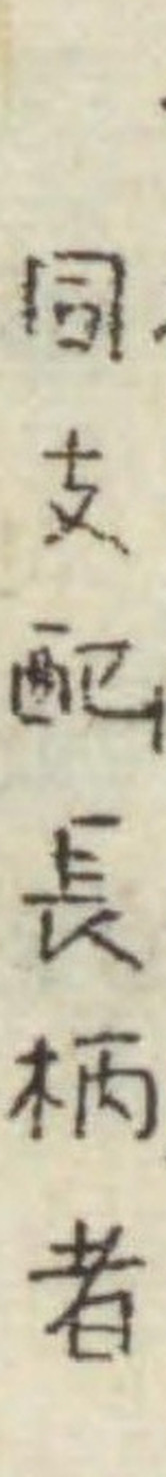同支配長柄者
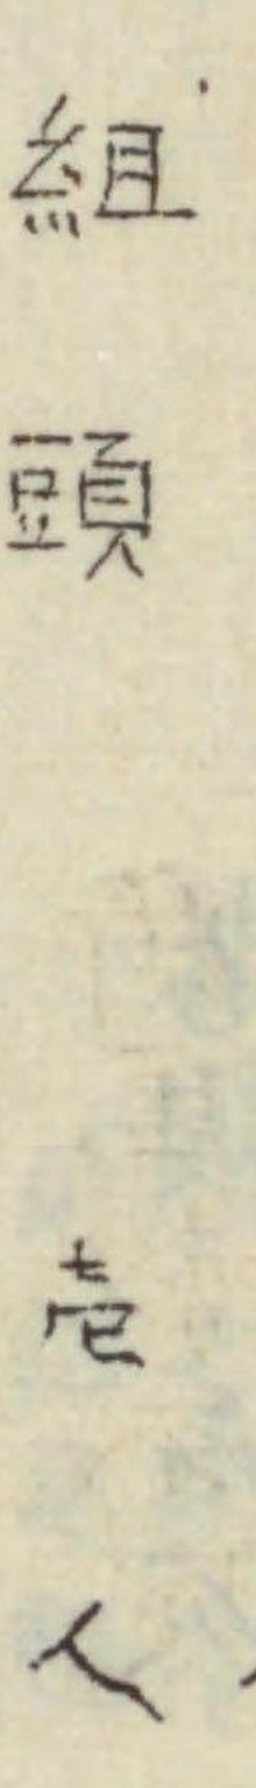組頭壱人
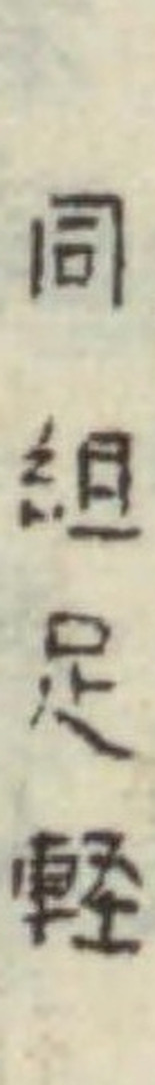同組足軽
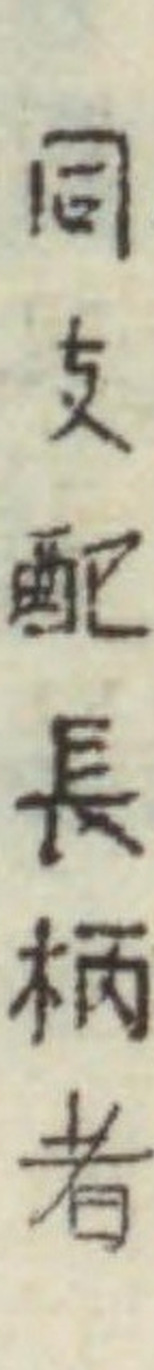同支配長柄者
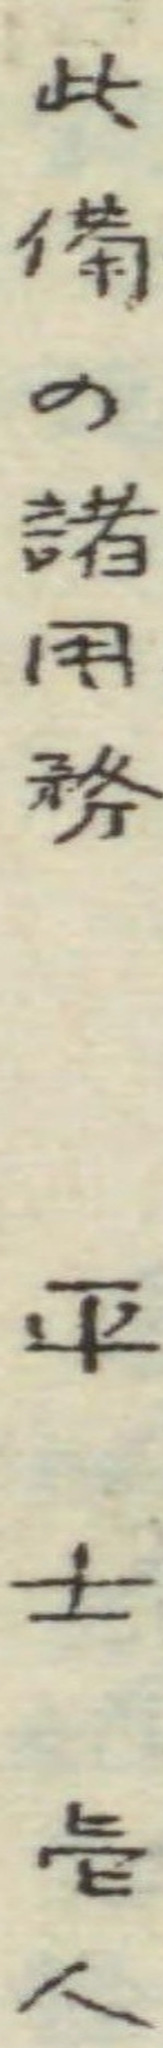此備の諸用務平士壱人
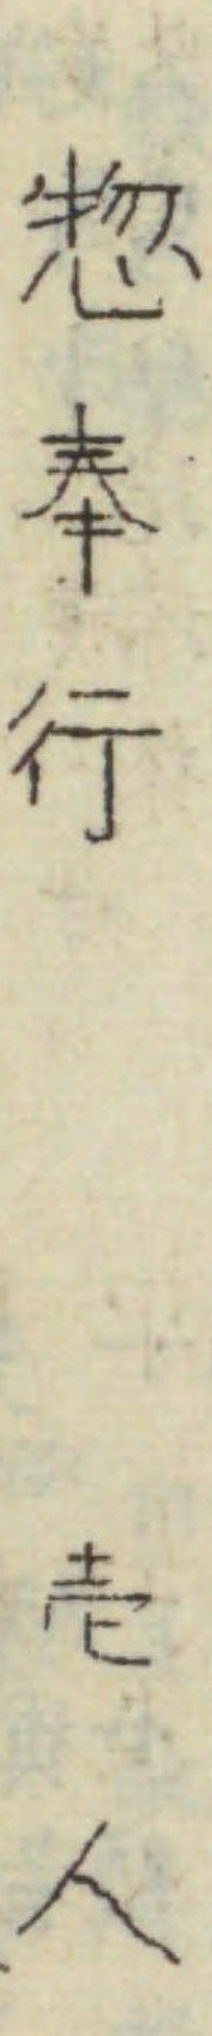惣奉行壱人
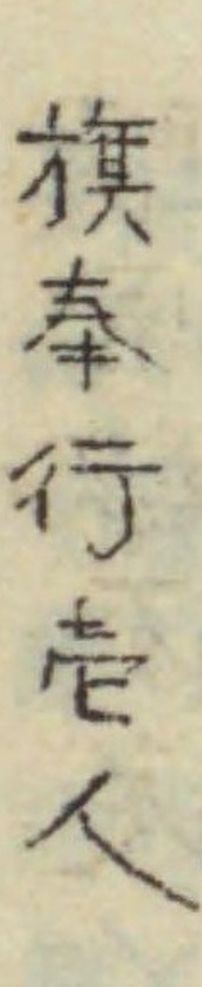惣奉行壱人

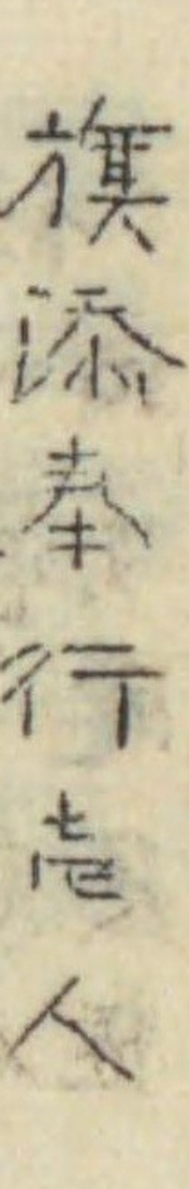旗添奉行壱人
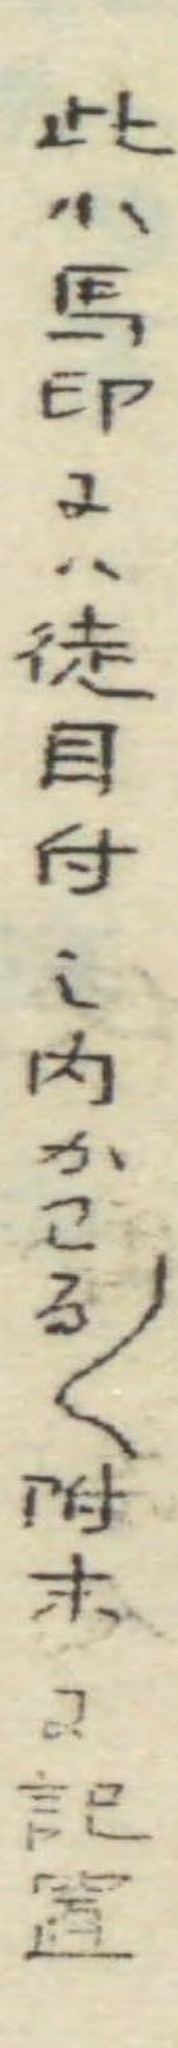此小馬印にハ徒目付之内かわる〳〵附未に記置
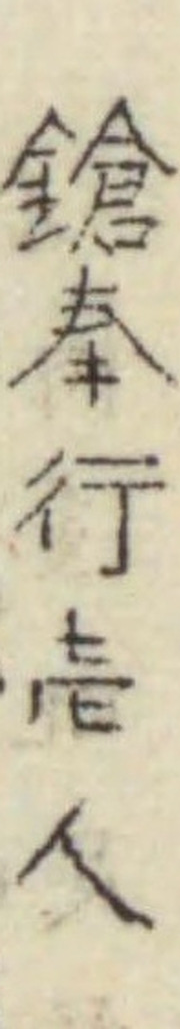旗添奉行壱人
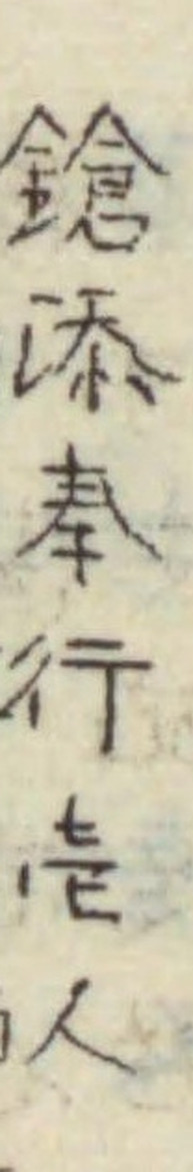旗添奉行壱人
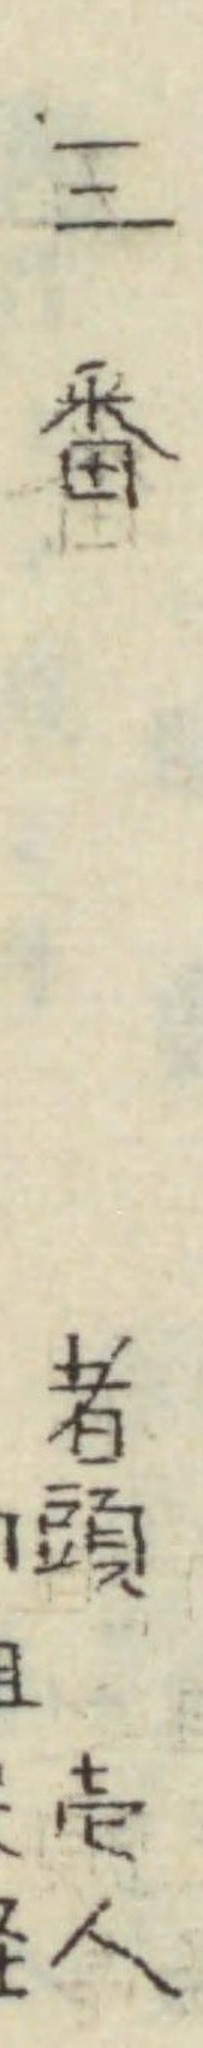一番者頭壱人
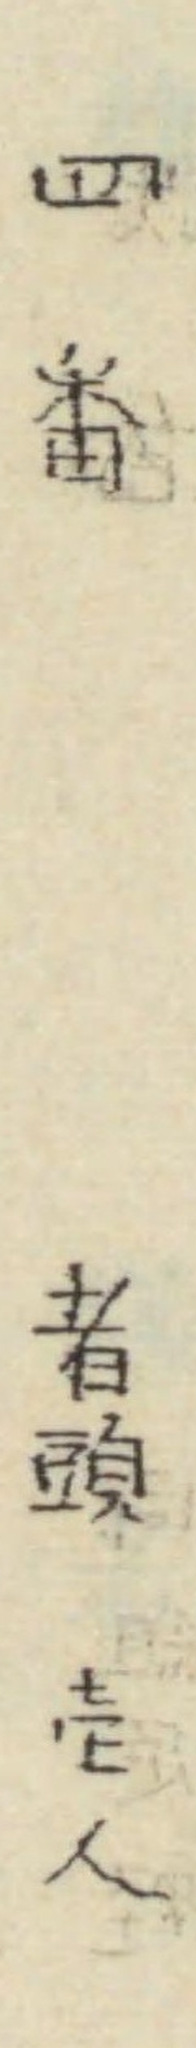四番者頭壱人
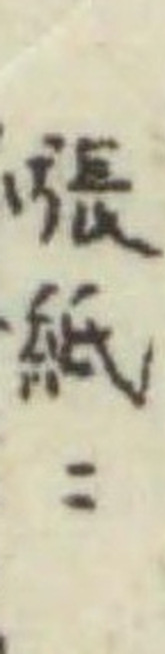張紙二
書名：三河吉田藩動員史料
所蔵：国立国会図書館 National Diet Library, JAPAN
